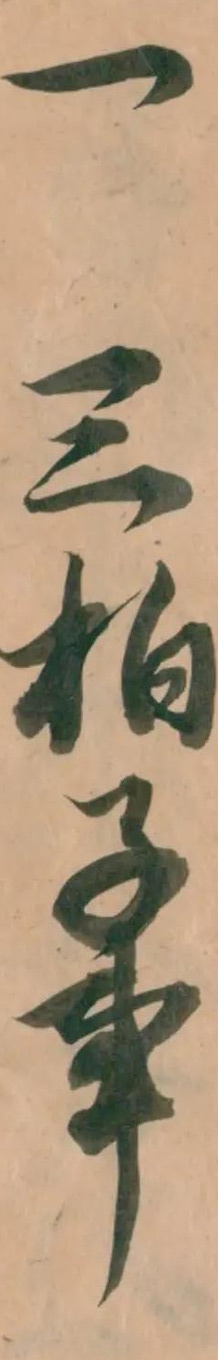一三拍子事
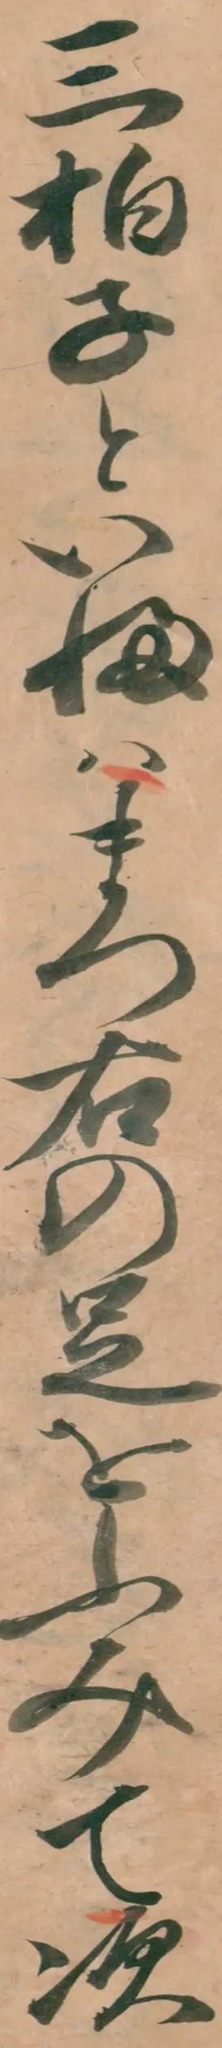三拍子といふハまつ右の足をふみて次
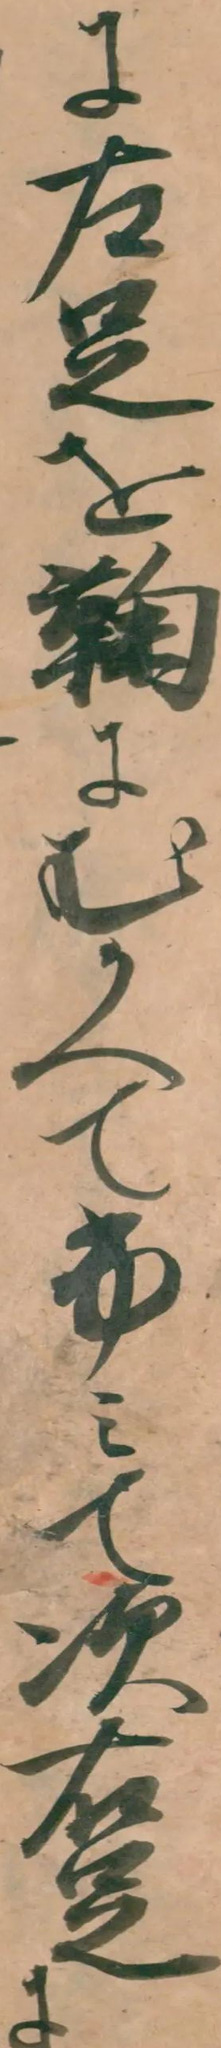に左足を鞠にむかへてふミて次右足に
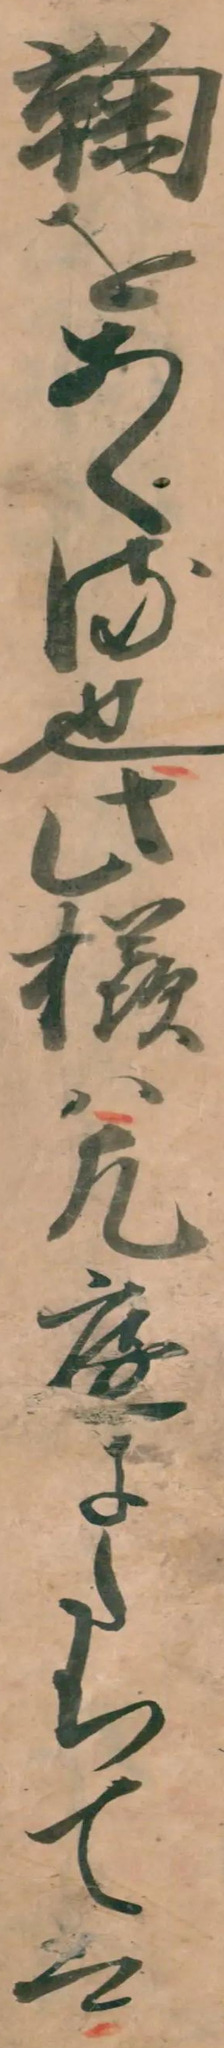鞠をあくる也此様ハ凡庭にたちては
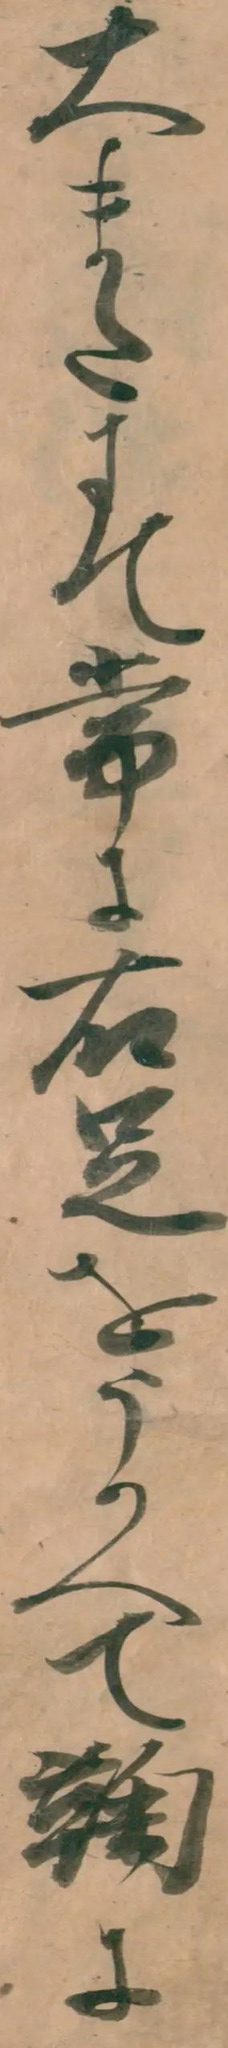大またにて常に右足をうかへて鞠に

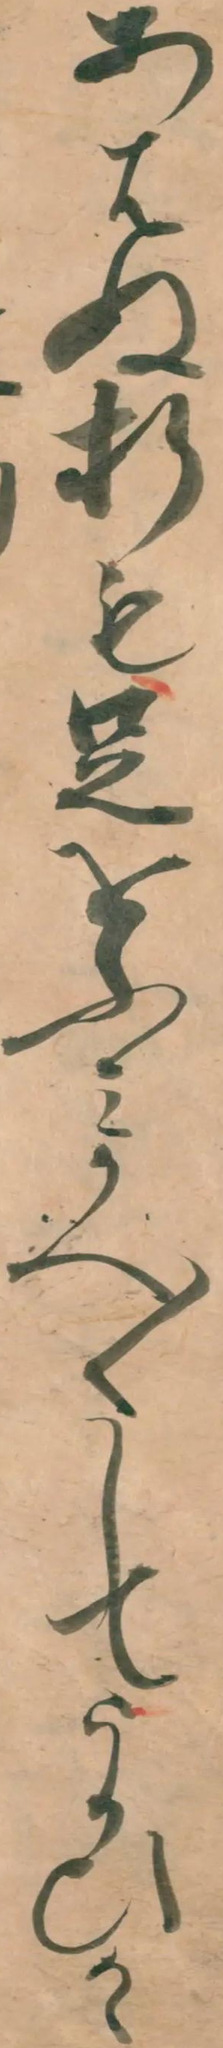あはぬ折も足をふミかへ〳〵してうかひかゝ
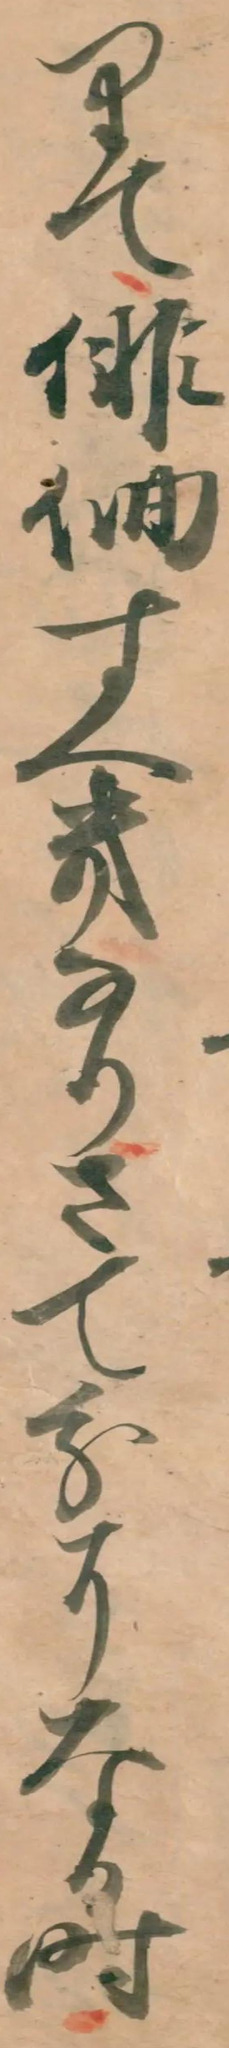りて徘徊すへきなりさて分になる時
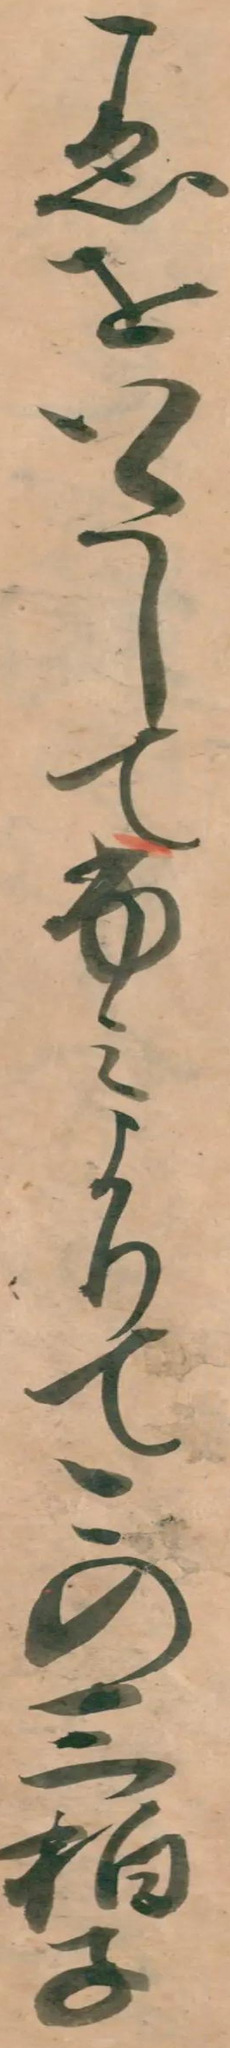こゑをいたしてふミよりてこの三拍子
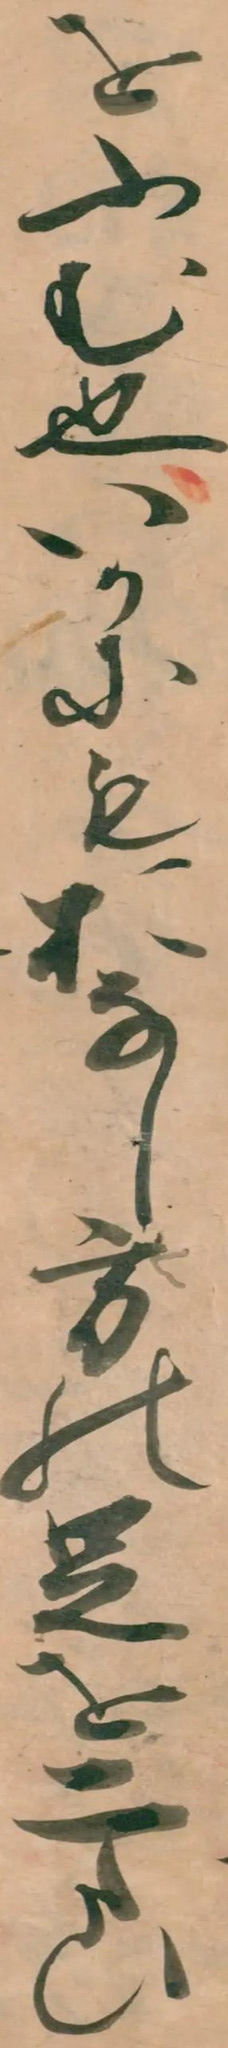をふむ也いかにもおなし方の足を二たひ
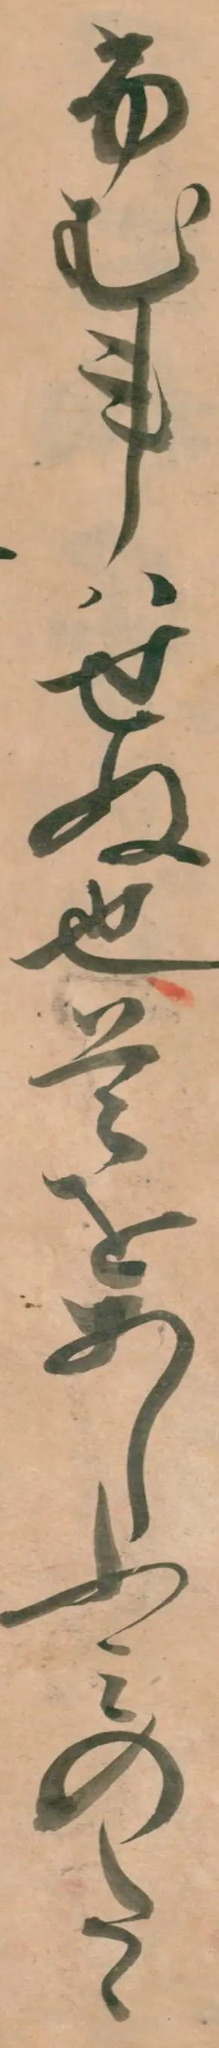ふむ事ハせぬ也是をあしふミのたゝ
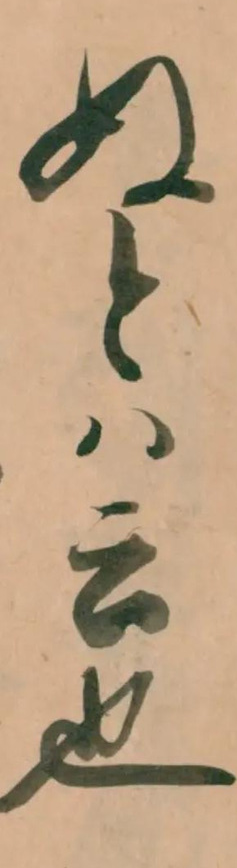ぬとハ云也
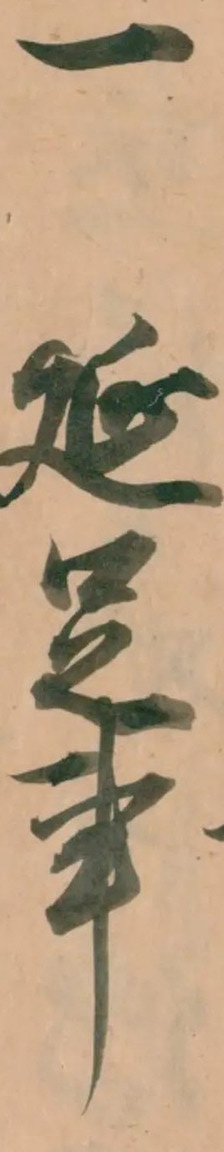一延足事
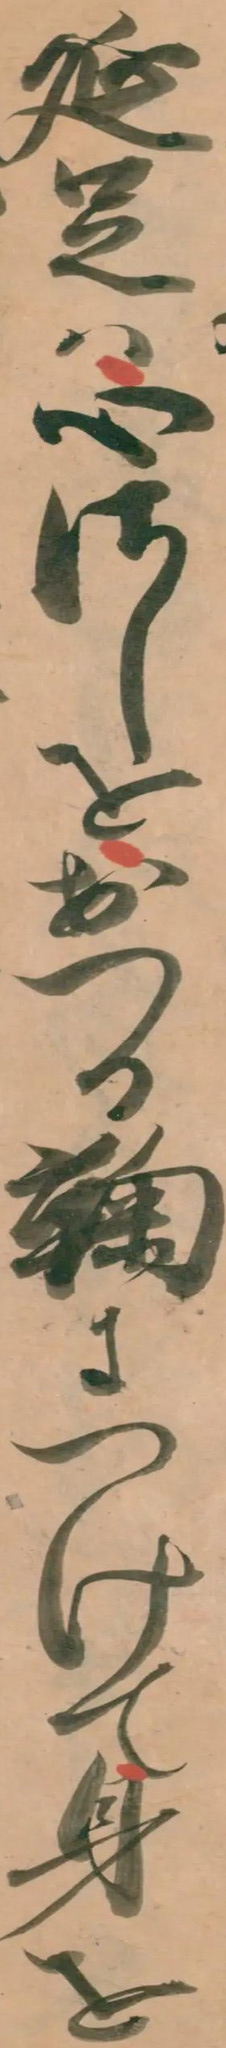延足ハ心さしをおつる鞠につけて身を
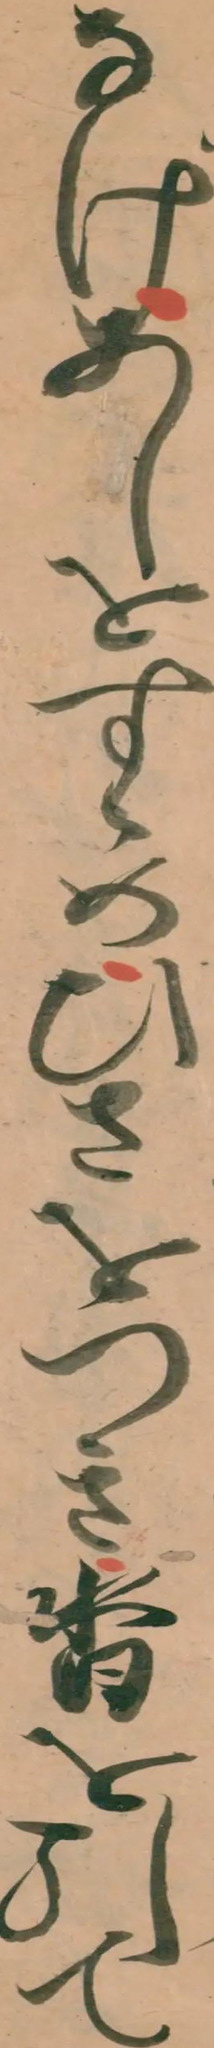なけあしをすゝめひさをつき沓を引て
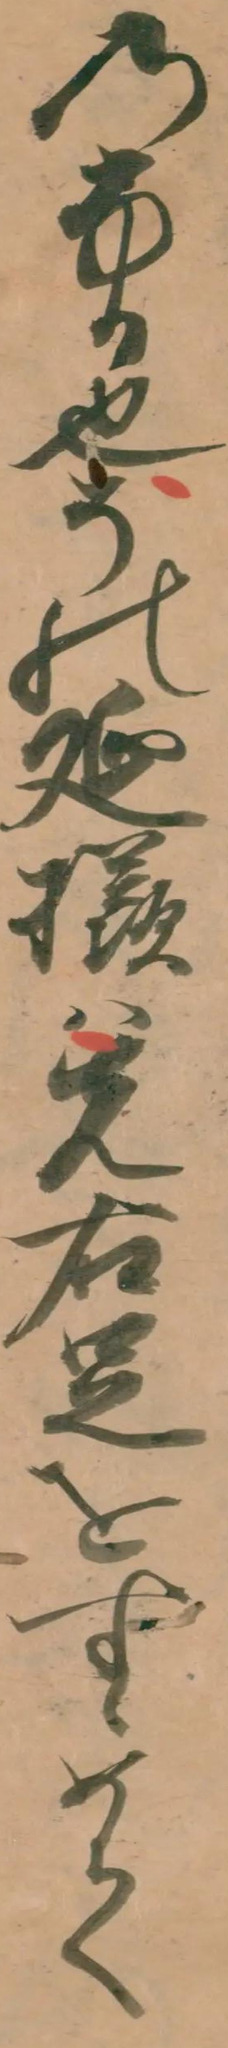のふる也その延様ハ先右足をすゝめて
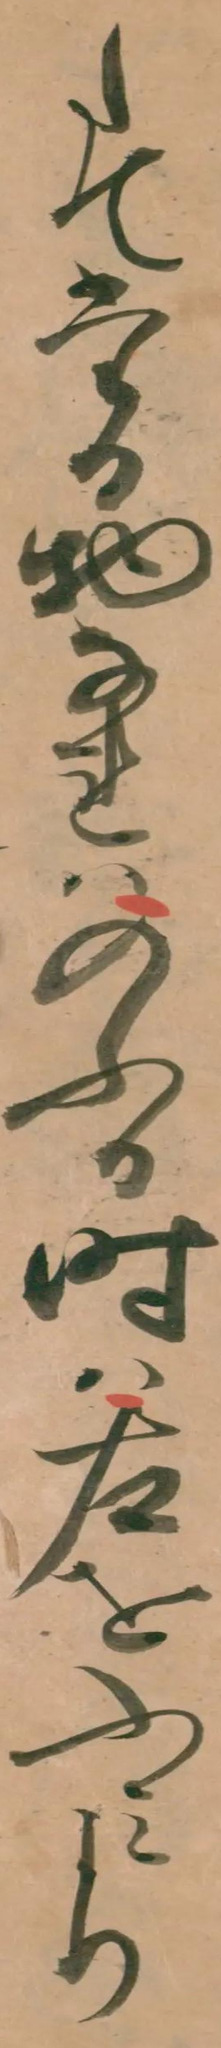たてたる物なれハのふる時ハ左をふミこり
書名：蹴鞠之条々大概
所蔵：国立国会図書館 National Diet Library, JAPAN
